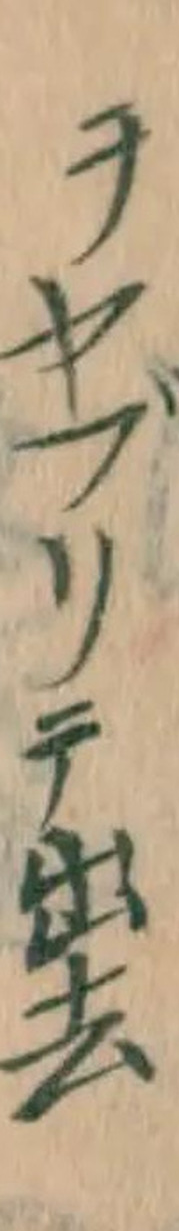ヲヤブリテ出去
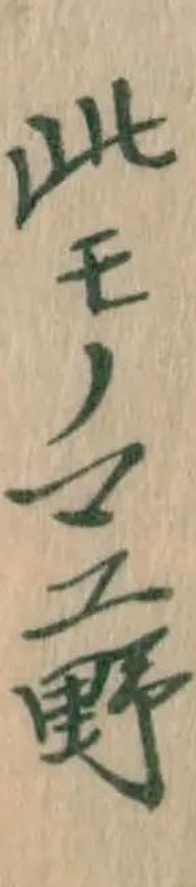此モノマユ野
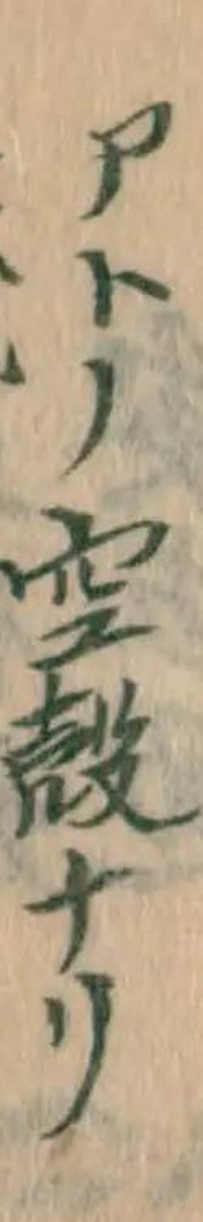アトノ空殻ナリ
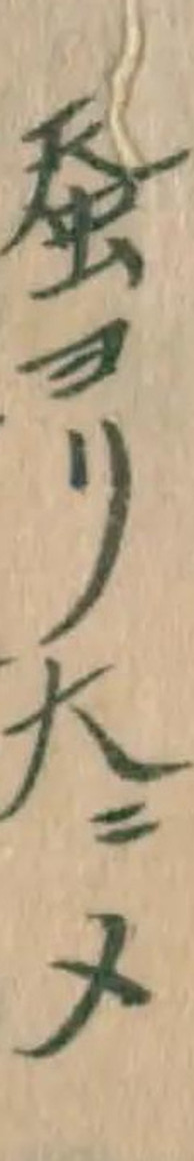蚕ヨリ大ニシテ
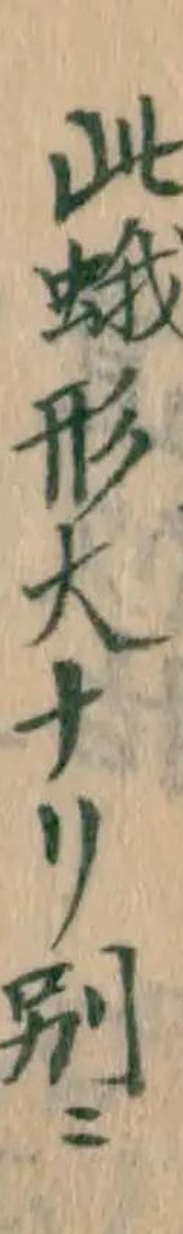此蛾形大ナリ別ニ
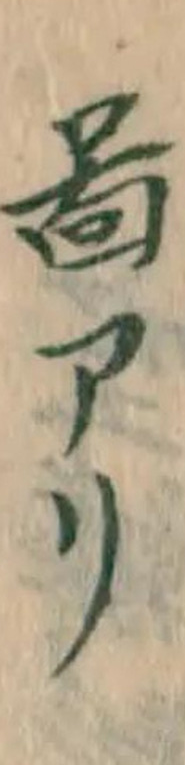啚アリ
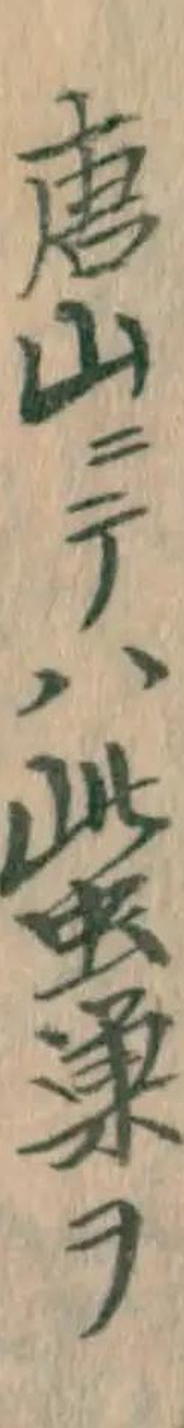唐山ニテハ此虫巣ヲ
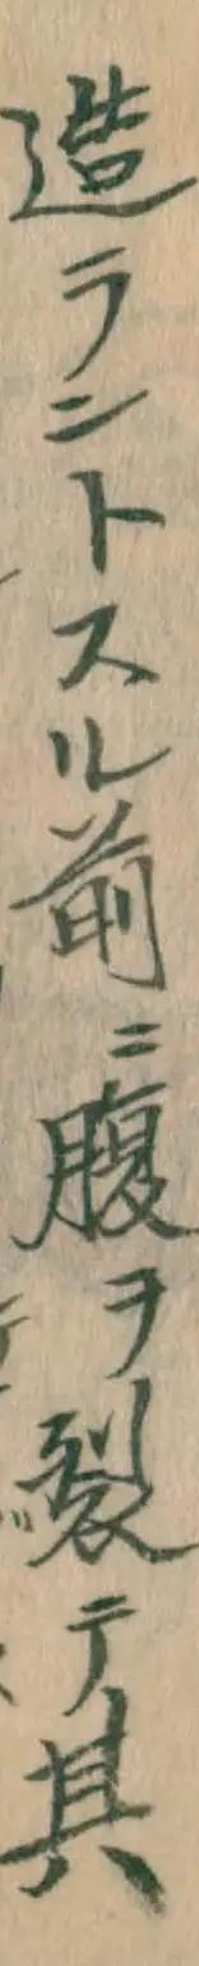造ラントスル前ニ腹ヲ裂テ其
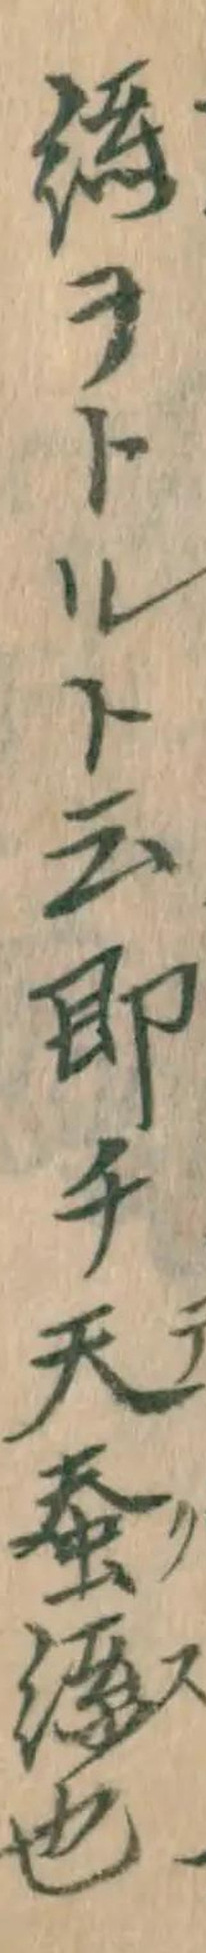絲ヲトルト云即チ天蚕絲也

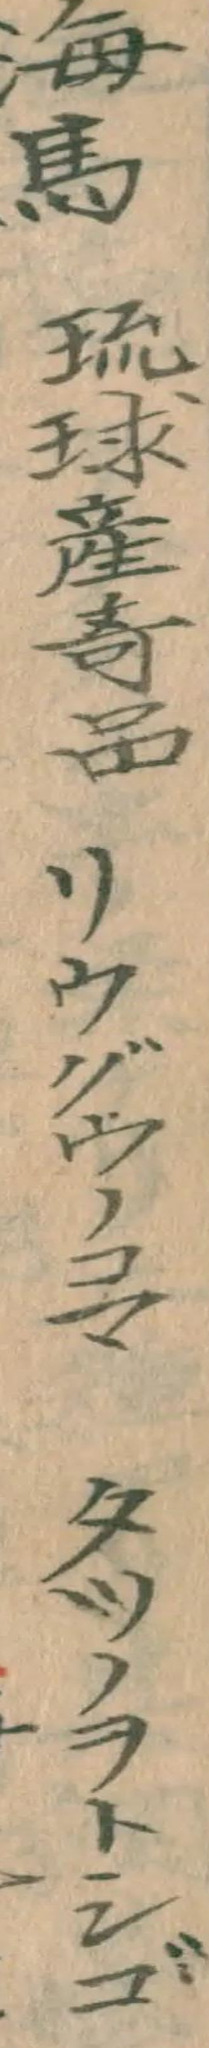海馬琉球産奇品リウグウノコマタツノヲトシゴ
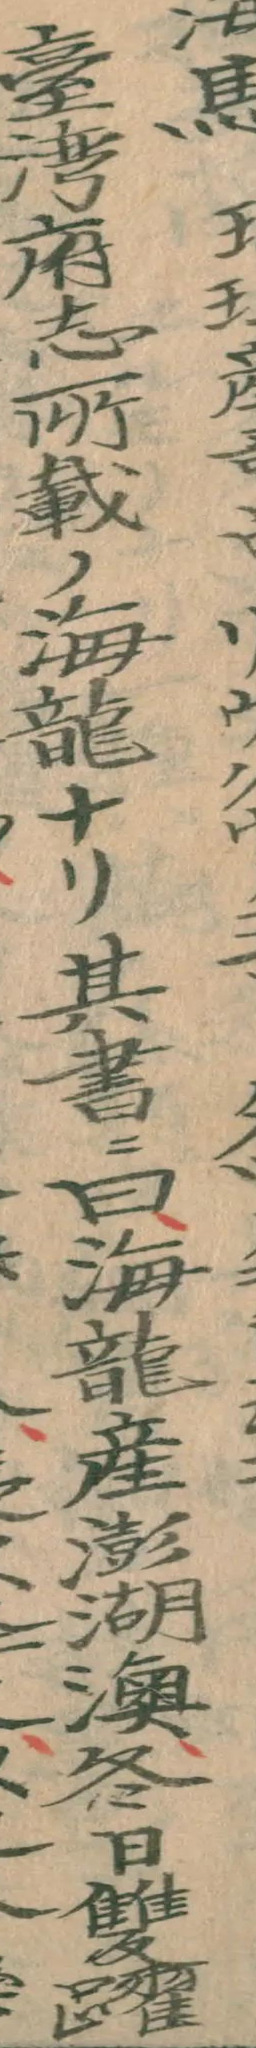臺湾府志所載ノ海龍ナリ其書ニ曰、海龍産澎湖澳、冬日雙躍
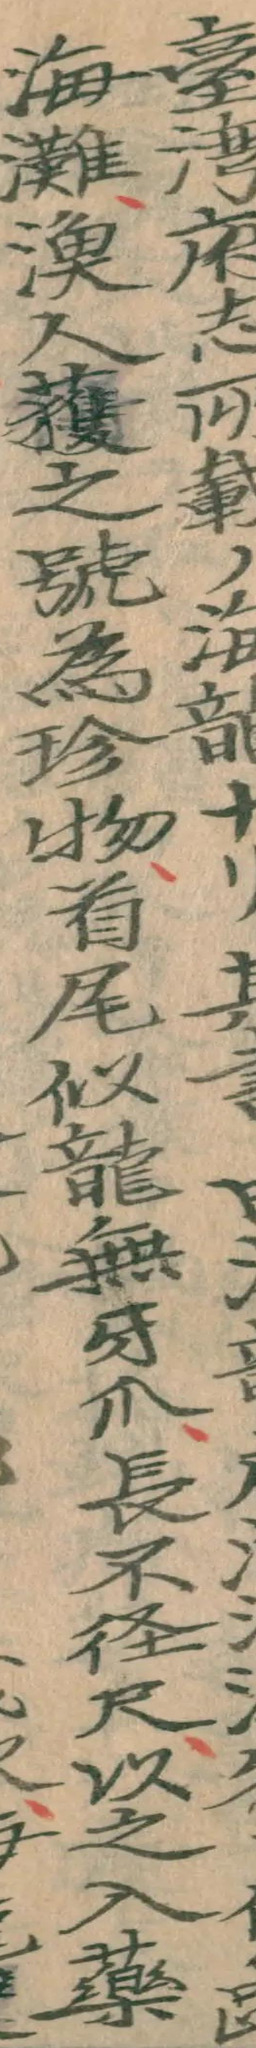海灘、漁人獲之號為珍物、首尾似龍無牙爪、長不径尺、以之入藥
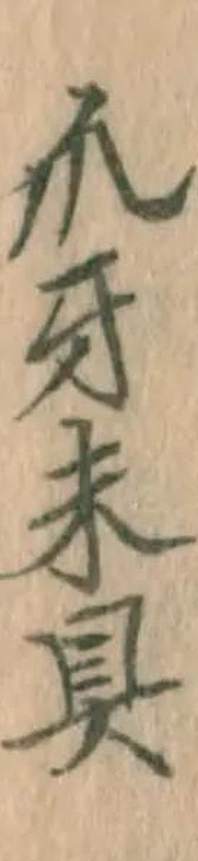爪牙未具
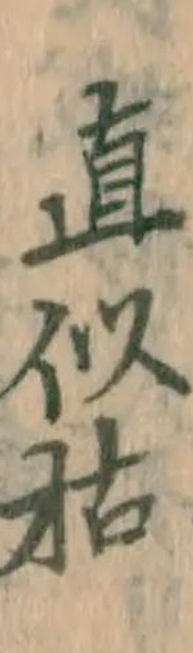直似枯
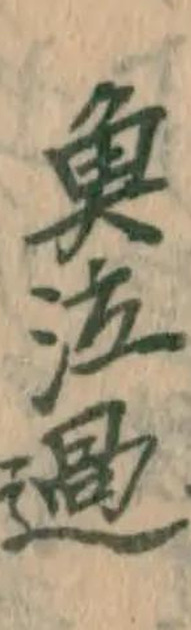魚泣過

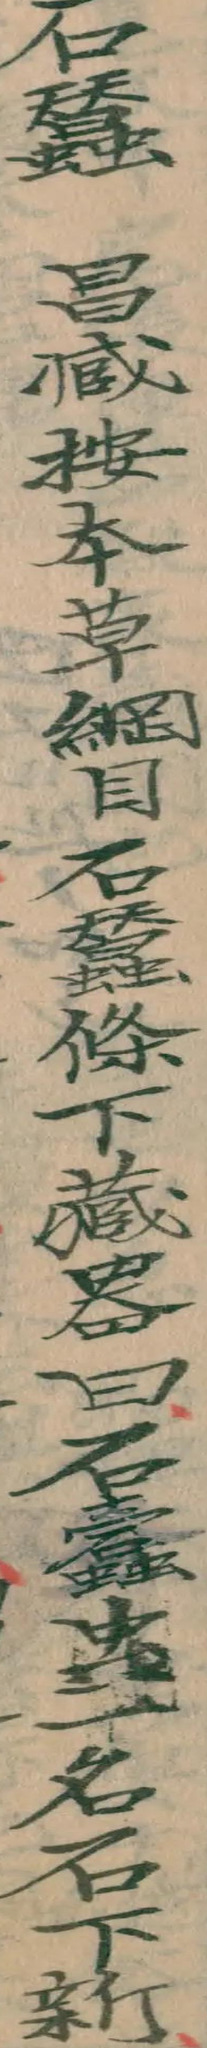石蟲昌臧按本草綱目石蟲條下藏器曰、石蠧蟲一名石下新、
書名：千蟲譜 3巻. [1]
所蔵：国立国会図書館 National Diet Library, JAPAN
